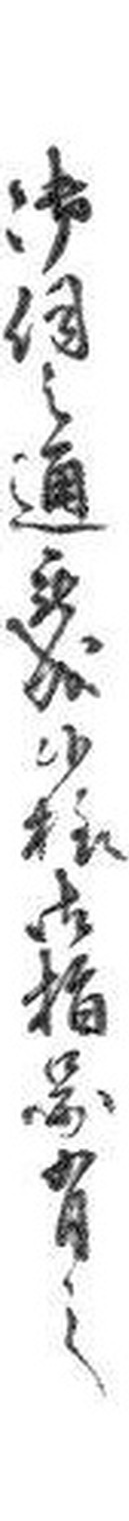御伺之通被成候様御指図有之
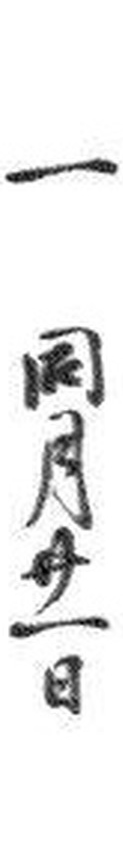一同月廿一日
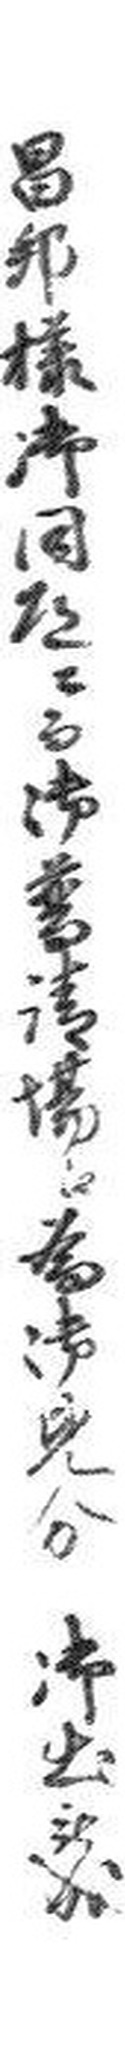昌邦様御同道ニ而御普請場江為御見分御出被成
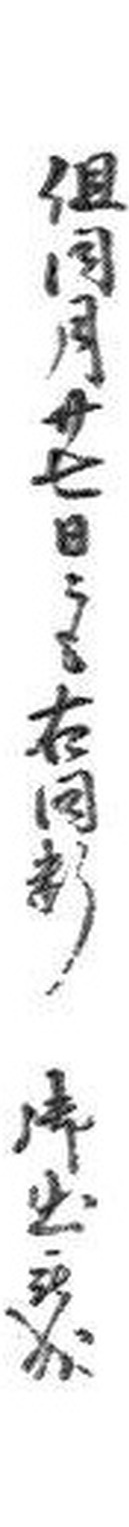但同月廿七日ニも右同断御出被成
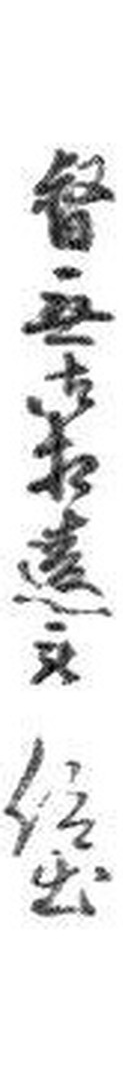督無御相違被仰出
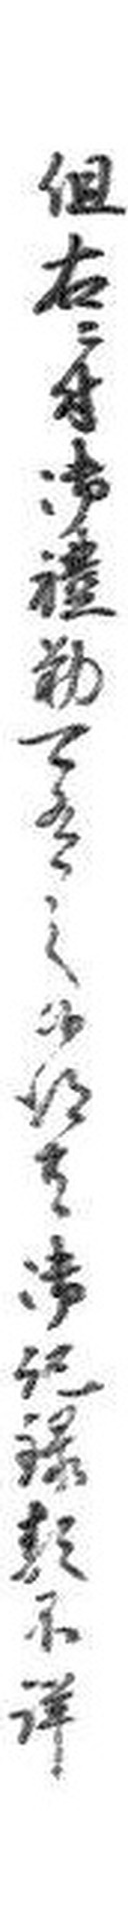但右ニ付御礼勤可有之候得共御記録類不詳
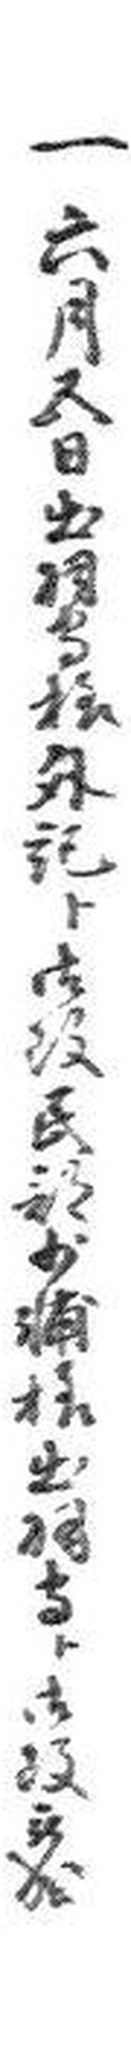一六月五日出羽守外記ト御改民部少輔様出羽守ト御改被成
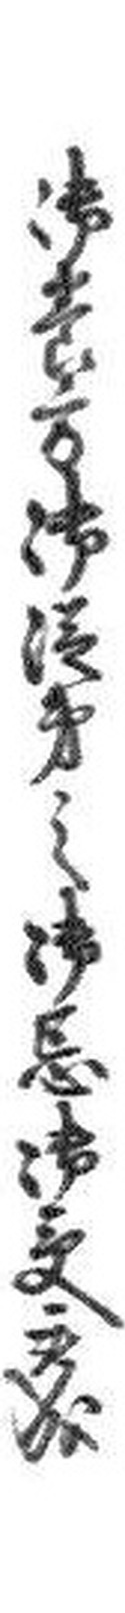御養方御従弟之御忌御受被成
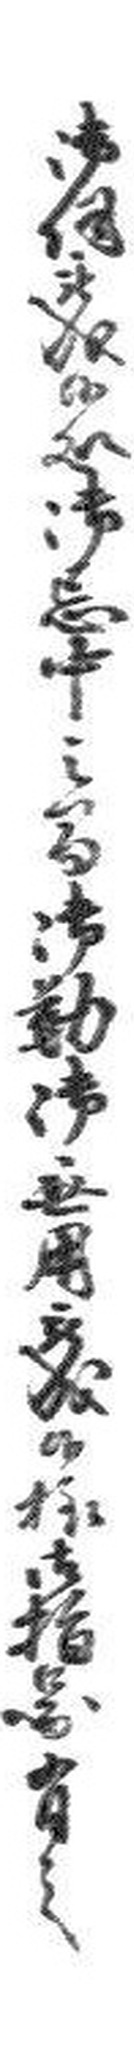御伺被成候処御忌中之間御勤御無用被成候様御指図有之

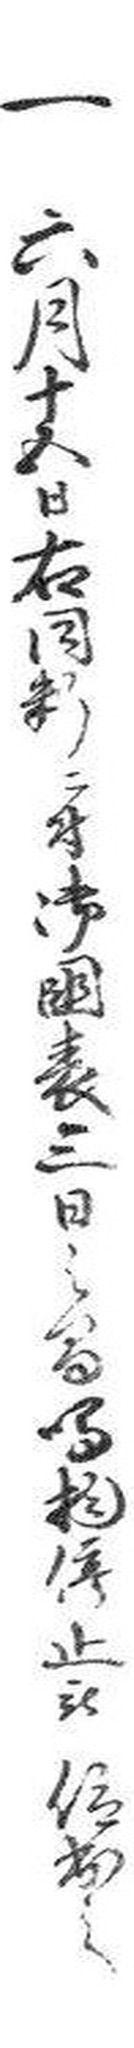一六月十五日右同断ニ付御国表三日之間鳴物停止被仰出之
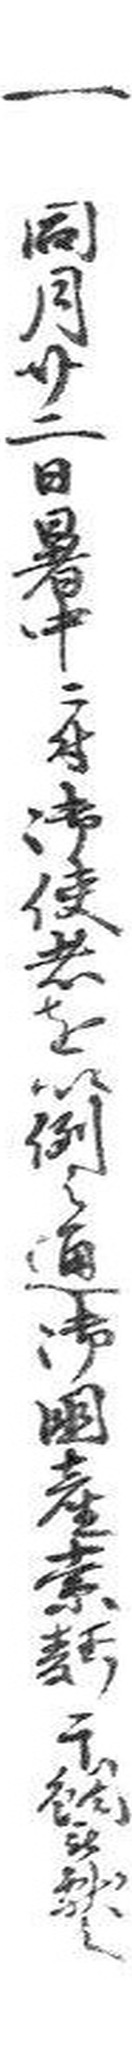一同月廿二日暑中ニ付御使者を以例之通御国産素麺干鯛被献之
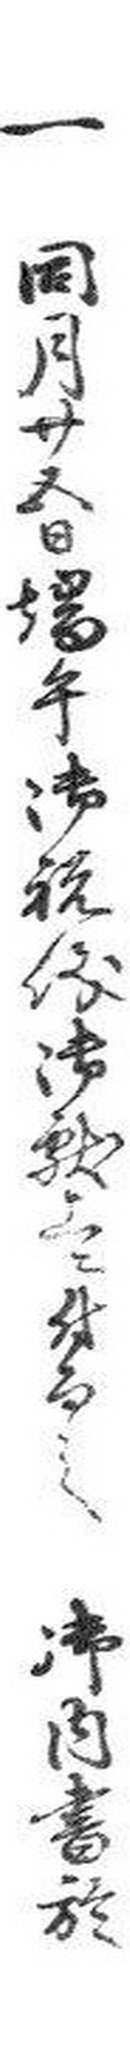一同月廿五日端午御祝儀御献上ニ付而之御内書於
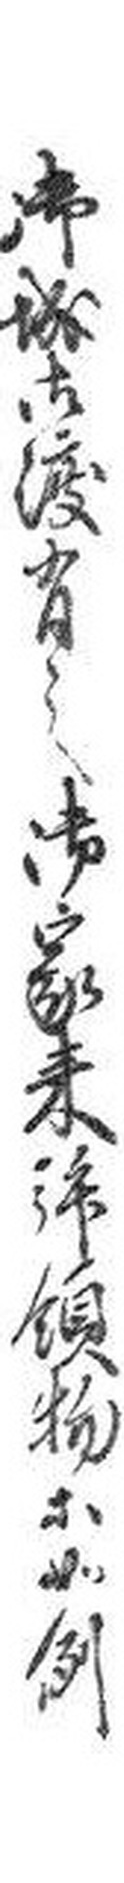御城御渡有之御家来拝領物等如例
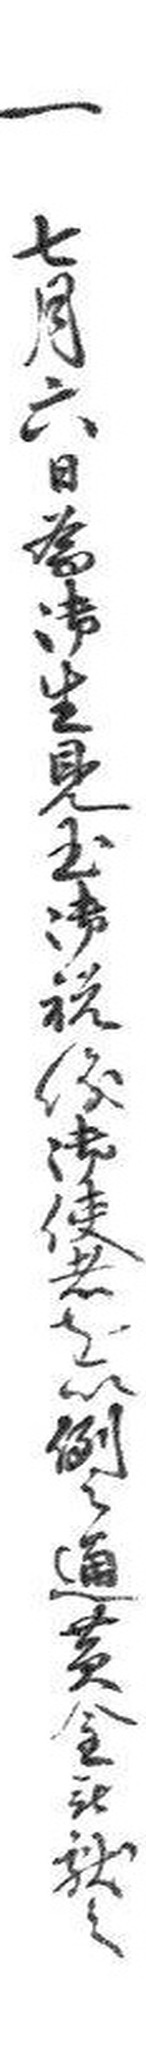一七月六日為御生見玉御祝儀御使者を以例之通黄金被献之
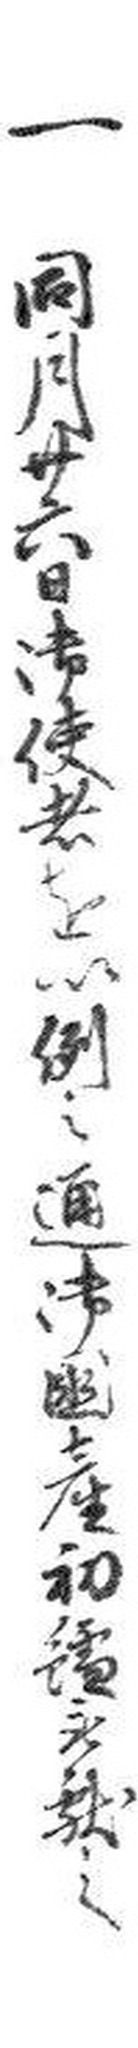一同月廿六日御使者を以例之通御国産初鱈被献之
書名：家譜 二十三 吉品公 従宝永元年到同二年
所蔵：福井県文書館 Fukui Prefectural Archives
